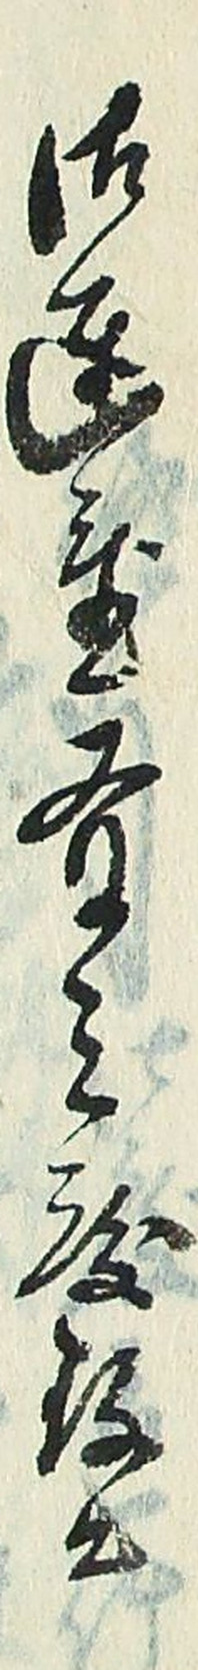御達置有之度存候

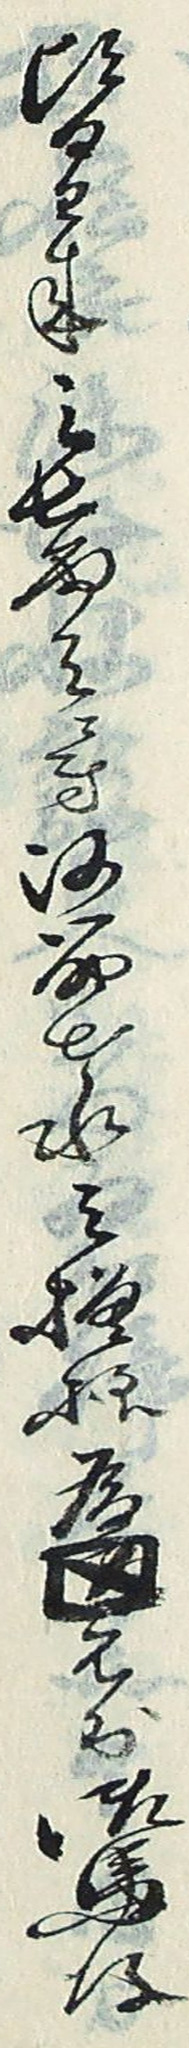頃日已来之長雨天ニ付河筋出水之模様為見分御馬役
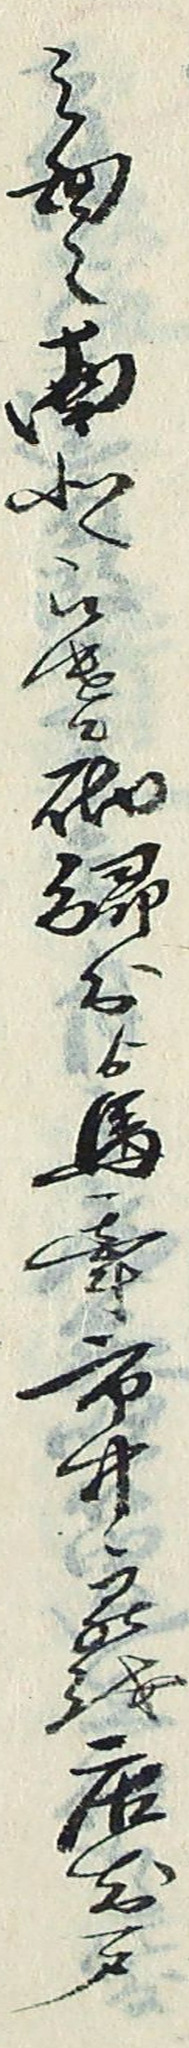之面々南北へ被遣候砌郷分ゟ馬牽市中へ罷越店前戸
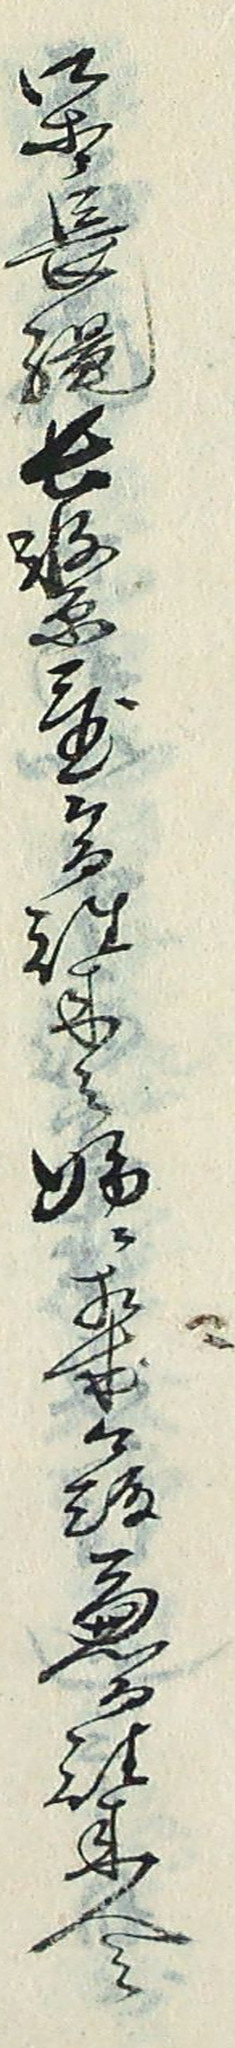口等長縄長繋置候而往来之妨ニ相成候趣兼而往来人之
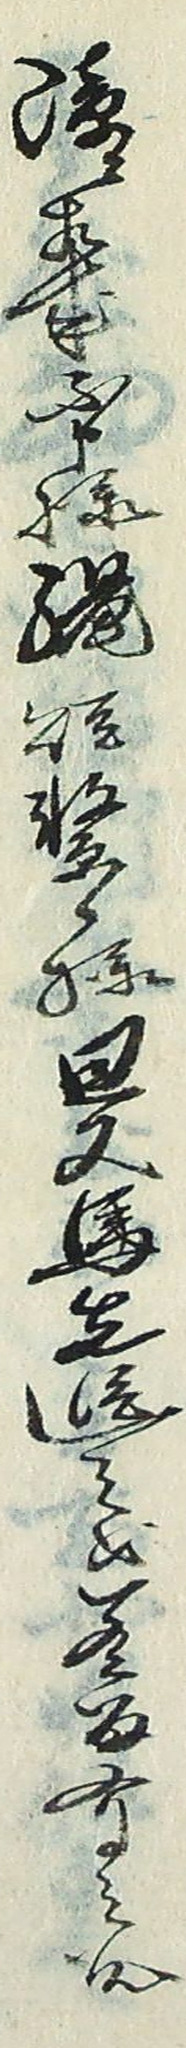障ニ相成不申様縄短繋候様且又馬先追之義差留有之所
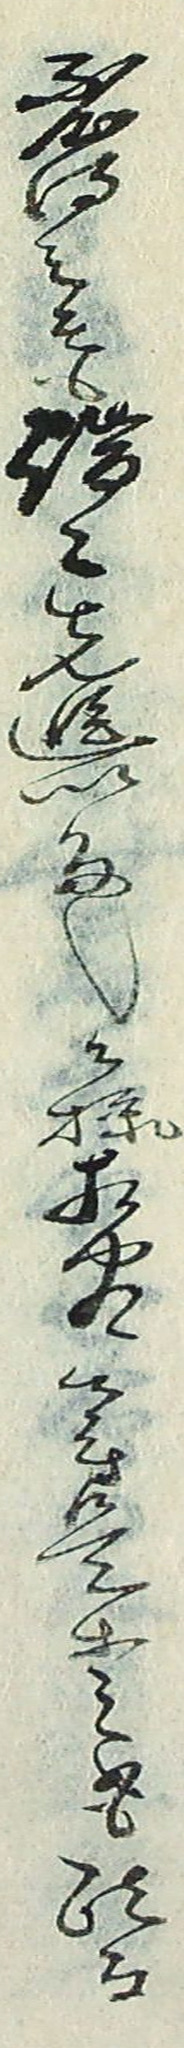不心得之者も端々先追いたし候様相聞候ニ付是等之義も屹と
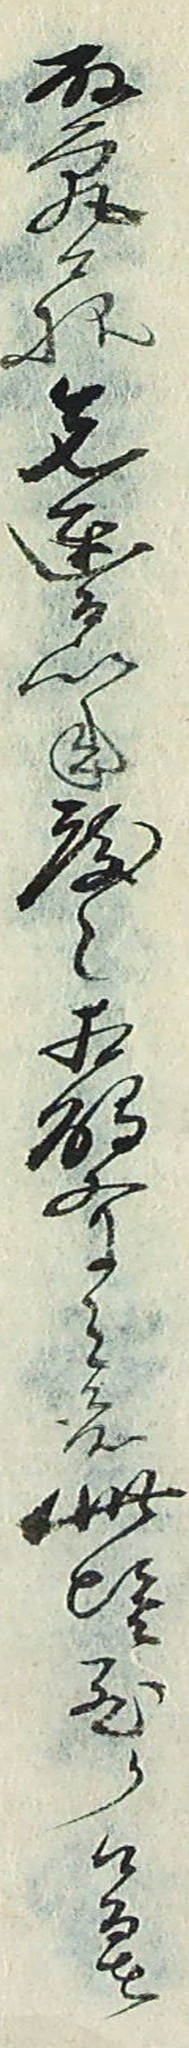取究候様先達而以来度々相觸有之候所此頃ニ至り候而者
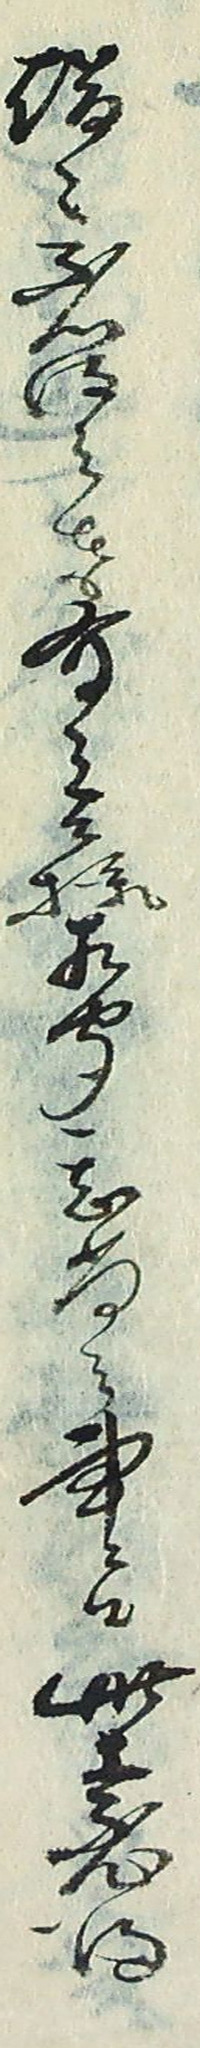端々不心得之者も有之候様相聞甚如何之事ニ候此上不心得
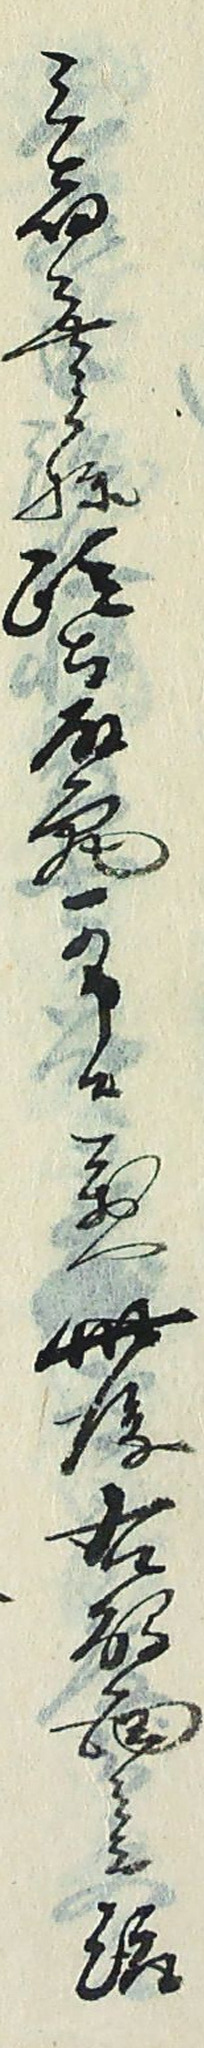之者無之様屹と取究可申候萬一此後右觸面之旨趣
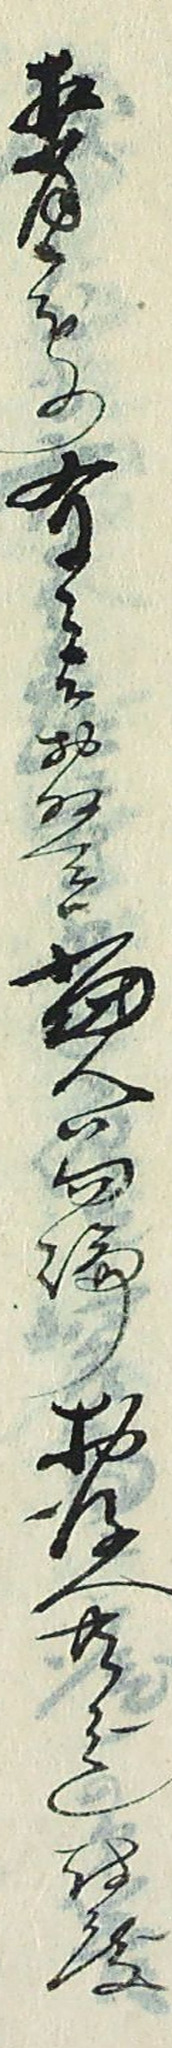相背候もの有之候ニおゐてハ當人ハ勿論村役人共迄越度
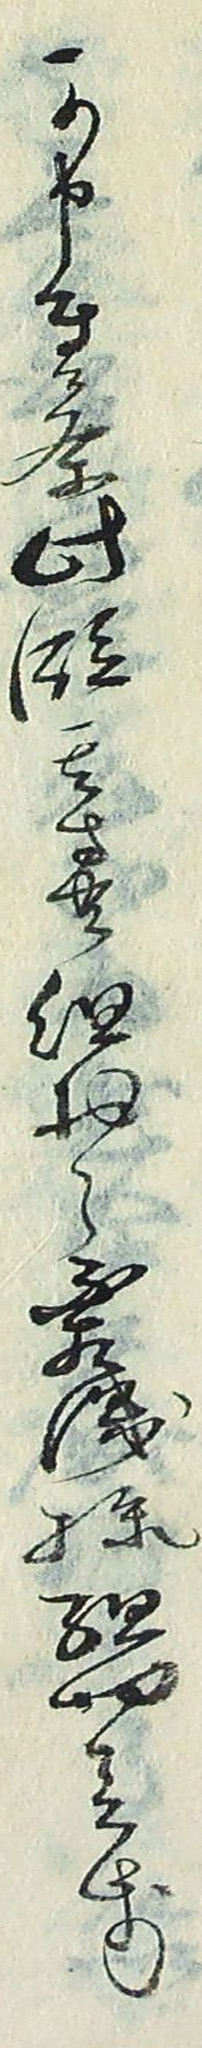可申付候条此段其方共組村々不相洩様組切壱帋
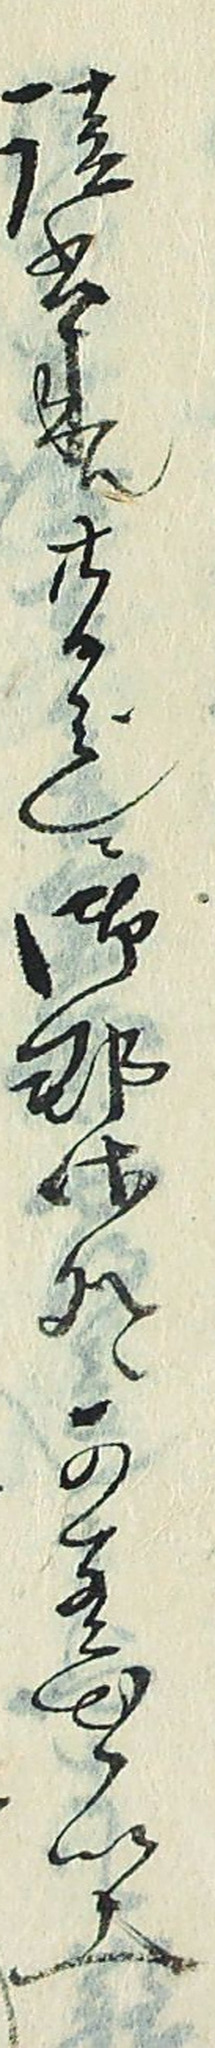請書来ル廿日迄ニ御郡代処へ可差出候以上
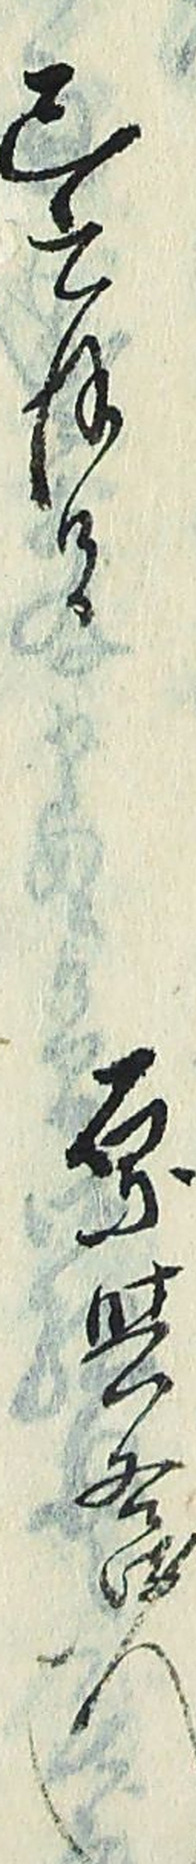巳六月四日原與右衛門
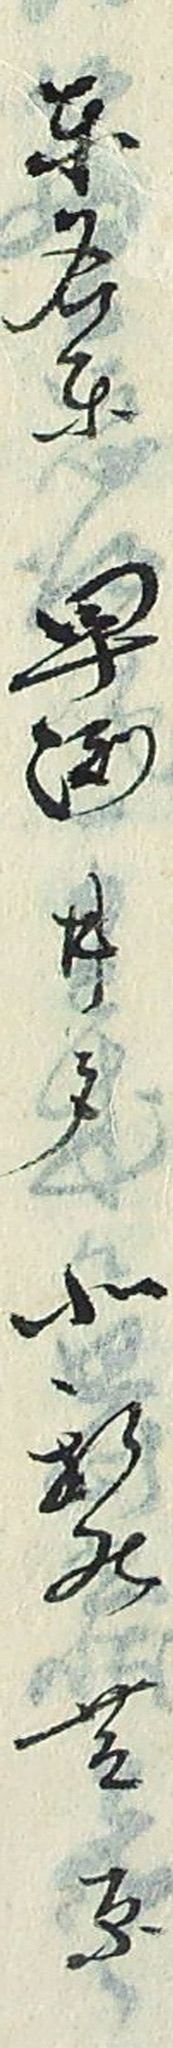東名東早渕井戸北新居芝原
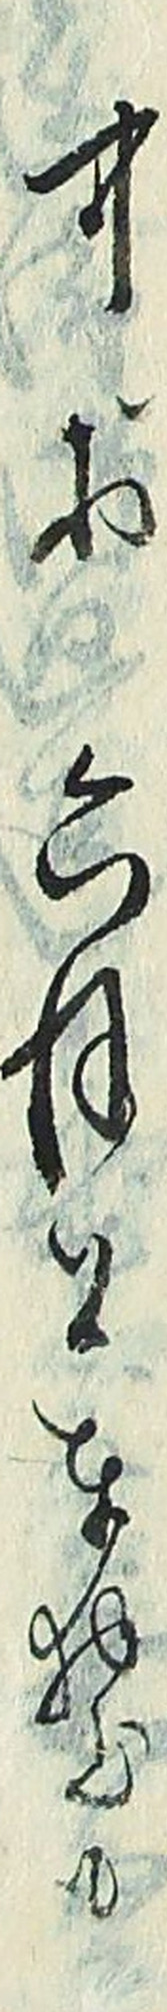中村六月八日奉拝上候
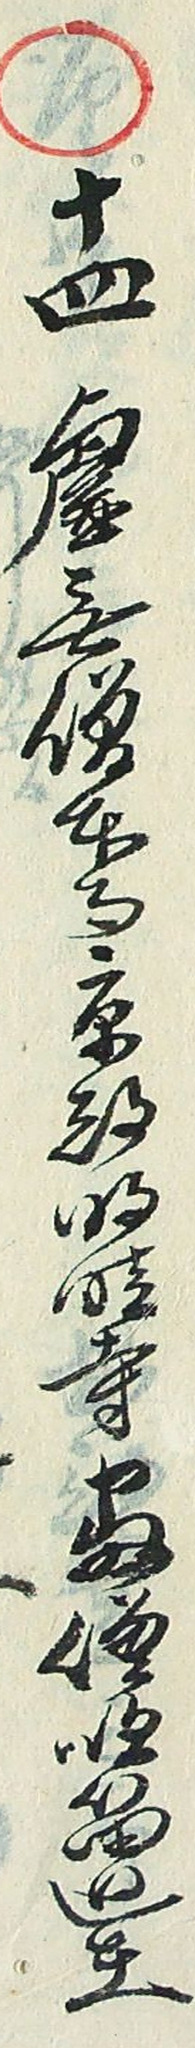○十四虚無僧本寺京都明暗寺番僧吹笛廻在
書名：諸御趣意書并御下知向之写
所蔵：鳴門教育大学 Naruto University of Education
